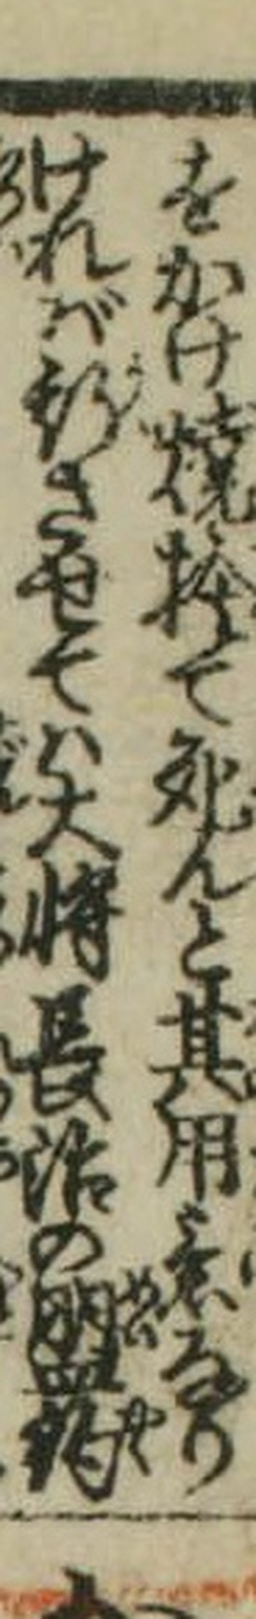ければ斯させては大将長治の盟約
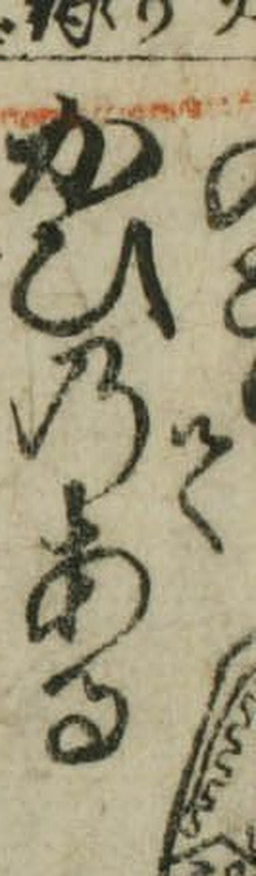かひのある
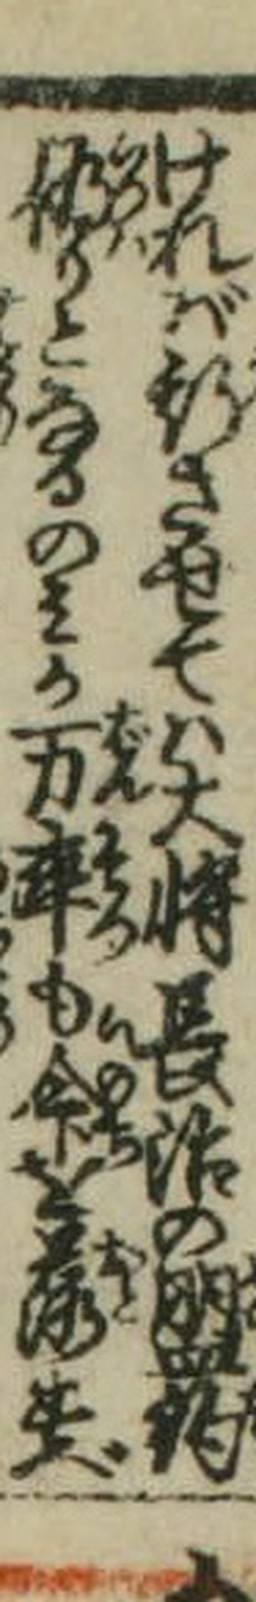偽りとなるのみか万卒も命を落すべ
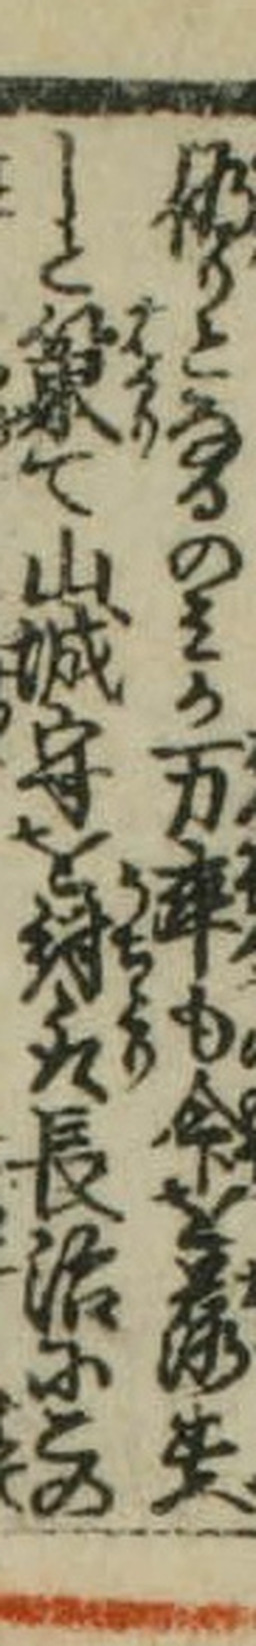しと策て山城守を討取長治にこの
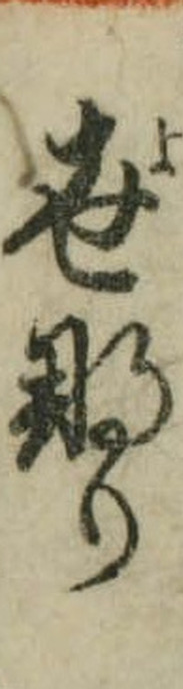世なり
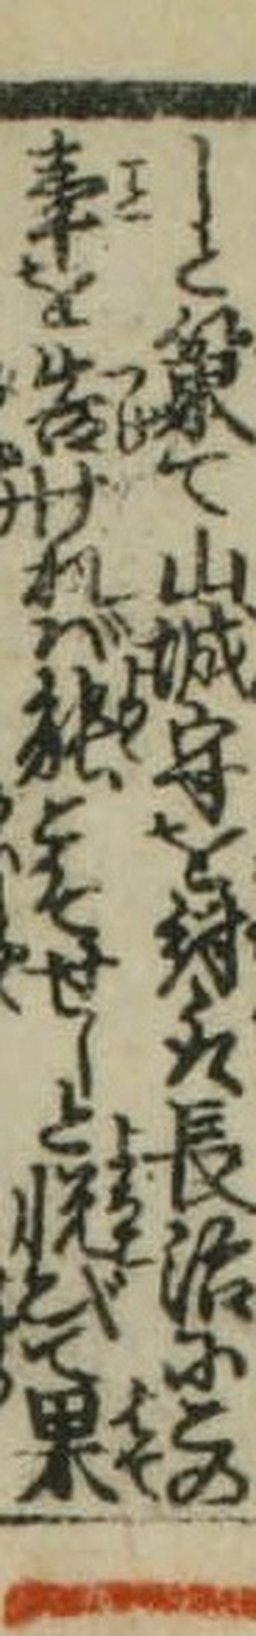事を告ければ能こそせしと悦びて果
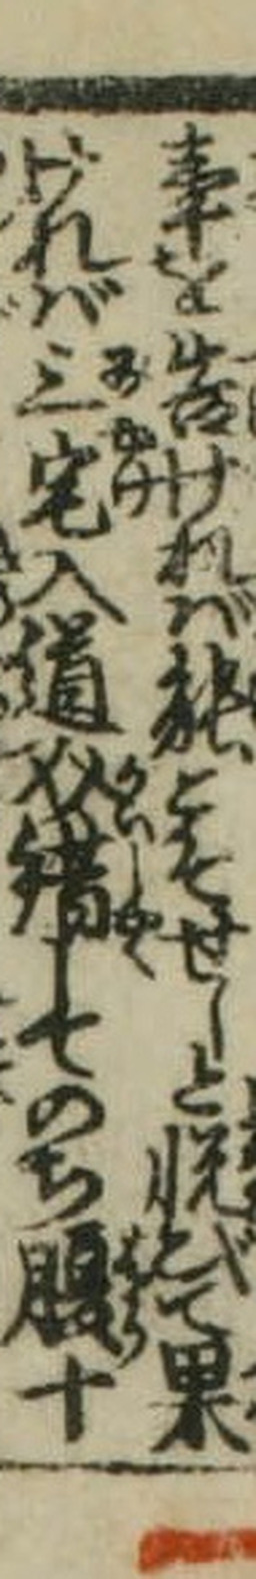ければ三宅入道介錯してのち腹十
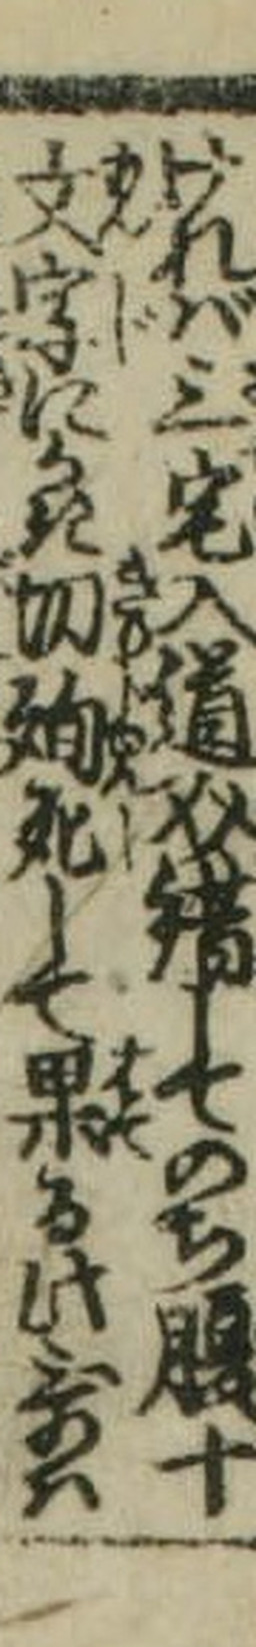文字にかき切殉死して果る此歌は
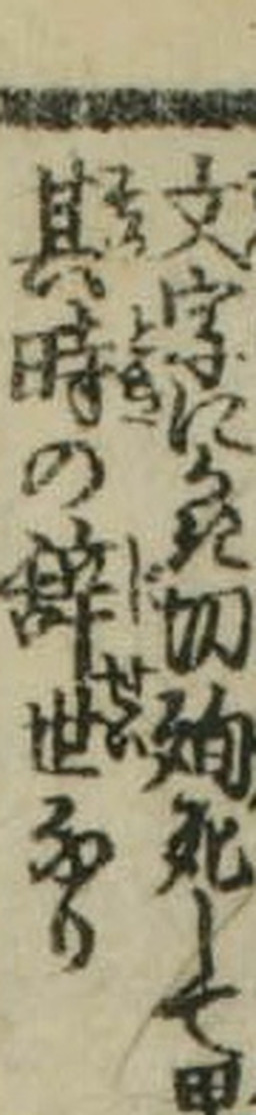其時の辞世なり
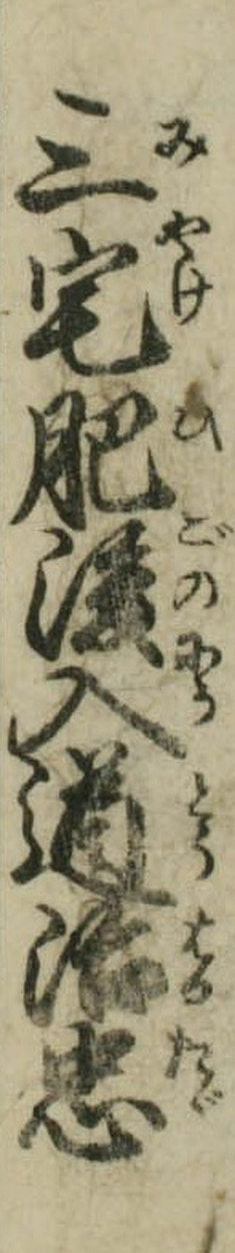三宅肥後入道治忠
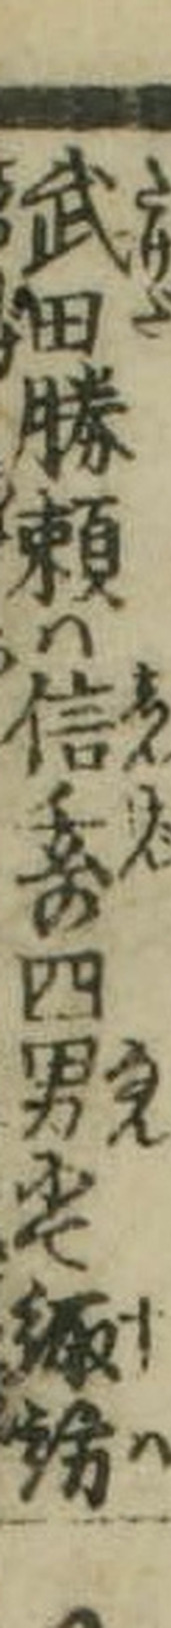武田勝頼は信玄の四男にて諏訪
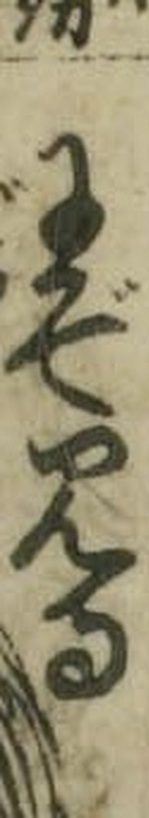にぞ見る
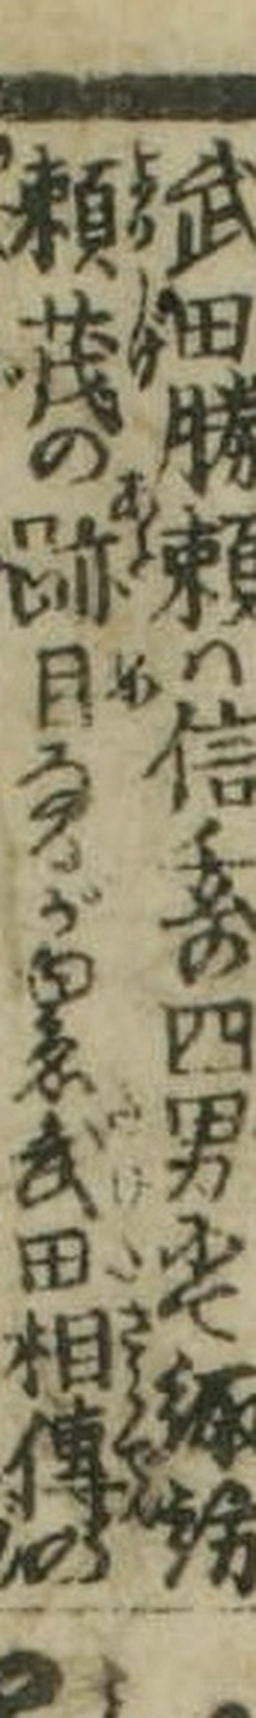頼茂の跡目なるがゆゑ武田相伝の
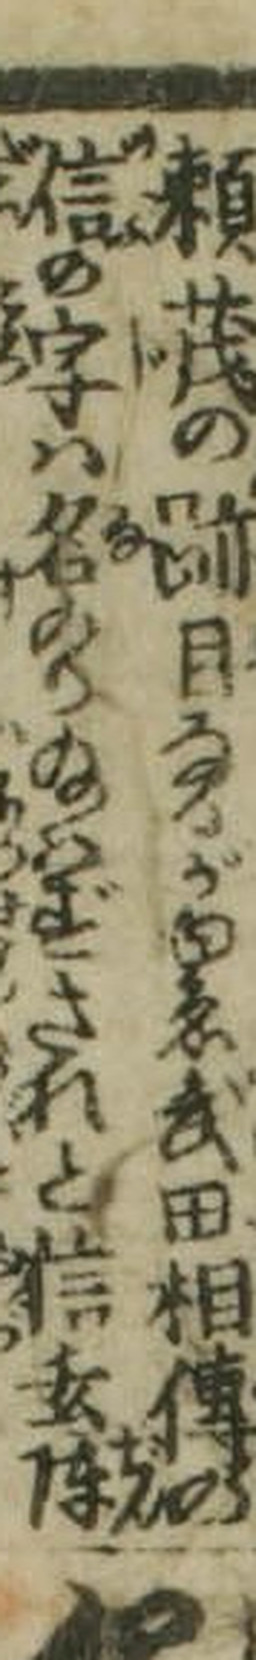信の字は名のり給はずされど信玄陣
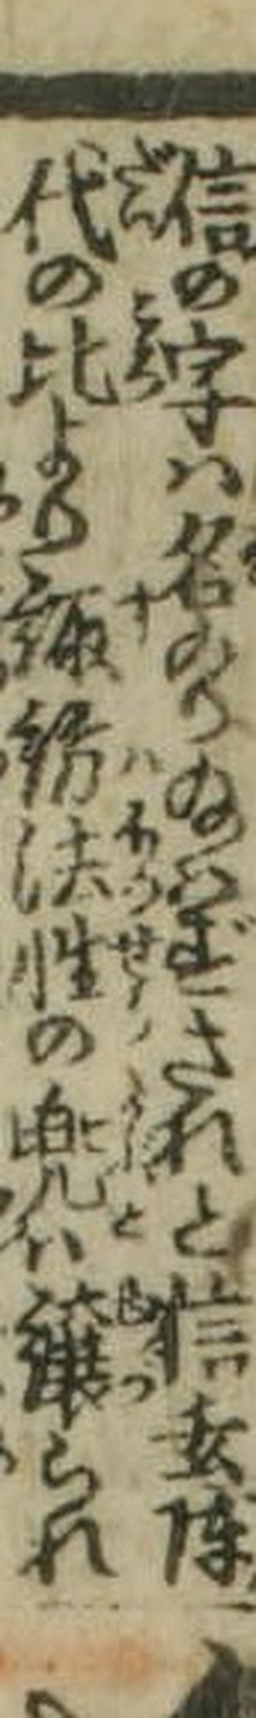代の比より諏訪法性の兜は譲られ
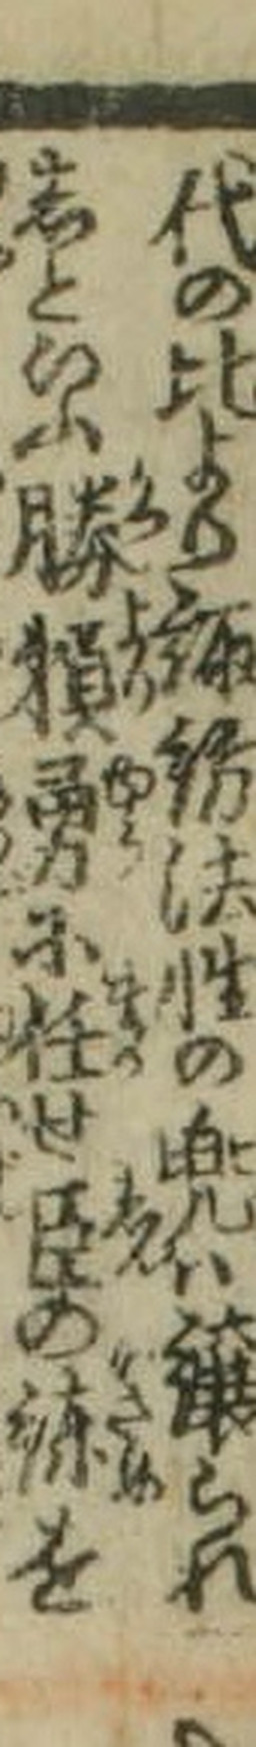しといふ勝頼勇に任せ臣の諌を
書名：續英雄百人一首
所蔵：東京学芸大学附属図書館
